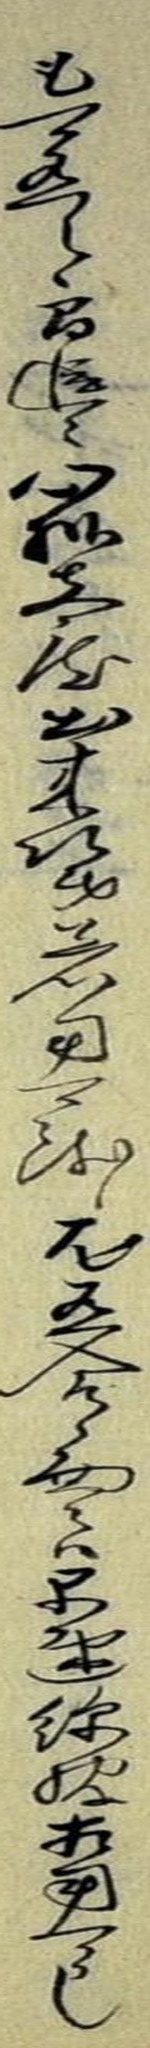も可有之候間追々心掛支度出来次第着用可致候尤有合候面々は早速綿服相用可申候
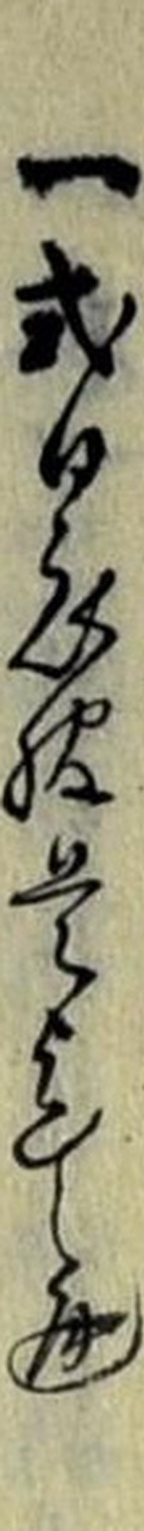一式日衣服是迄之通
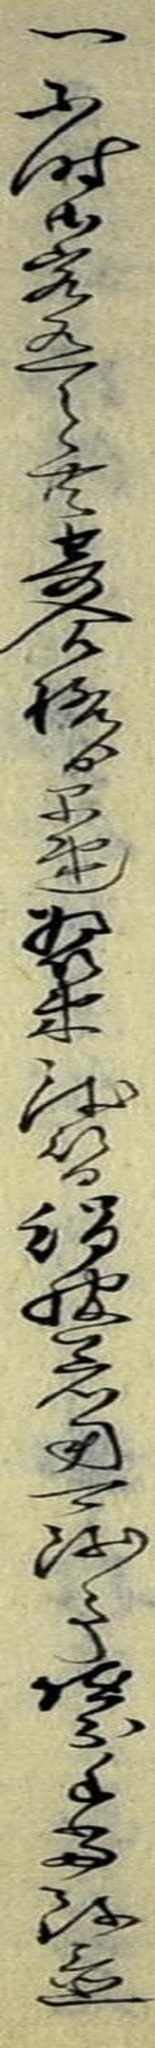一不時御客有之候共寄合格ゟ早速装束致替絹服着用可致事随分手当致置
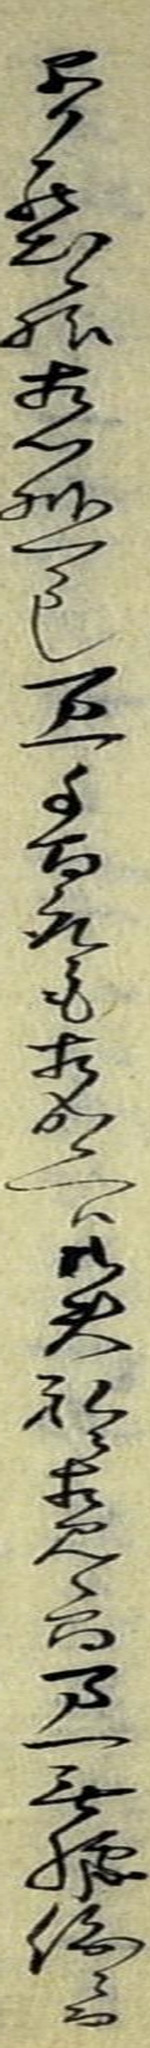早く罷出候様相心掛可申候万一手間取にも相成候へは御失礼に相見候間万一無拠儀に而
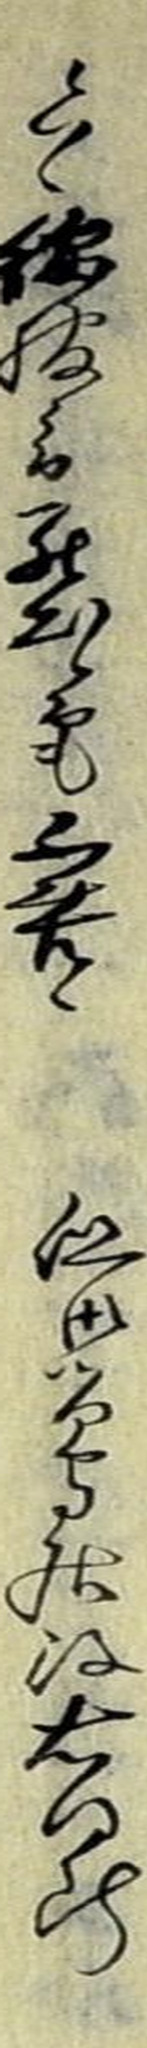候はゝ綿服に而罷出候而も不苦候但御留守居役右同断
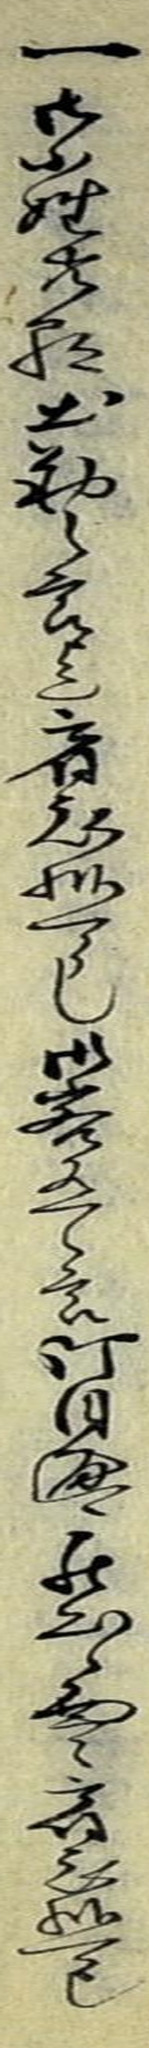一御小姓共願出勤之節迄肩衣掛可申候御客有之節御目通へ罷出候面々肩衣掛可申候
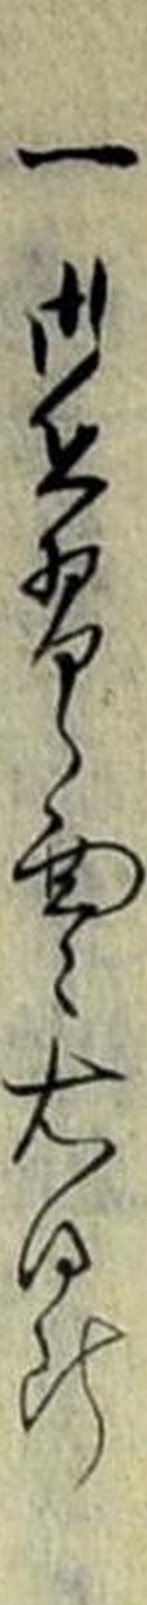一御近習之面々右同断
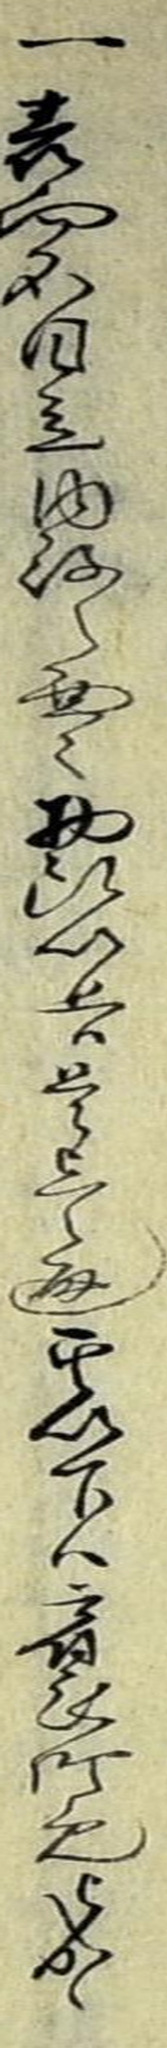一表向不目立内役之面々物頭以上は是迄之通其以下は肩衣御免被成候
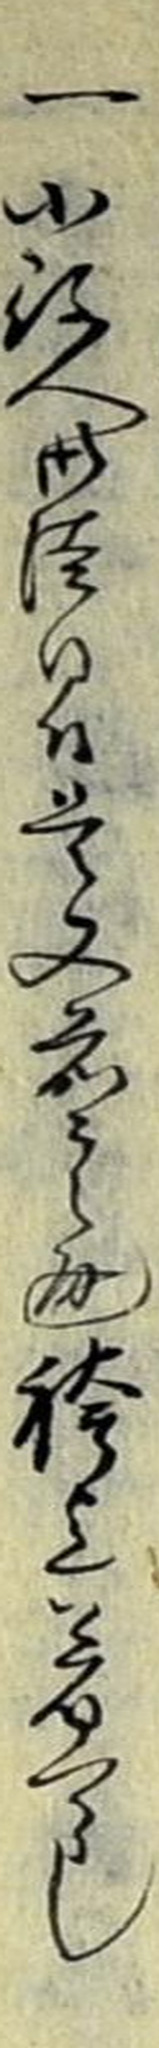一小役人御徒目付是又前々之通袴迄着可申候
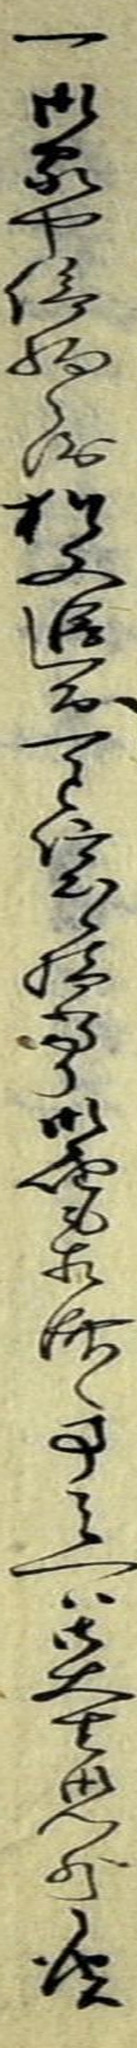一御家中倹約之儀猶又追而可被仰出候指当り御届も相済候事に候へは御使者御門外之儀は
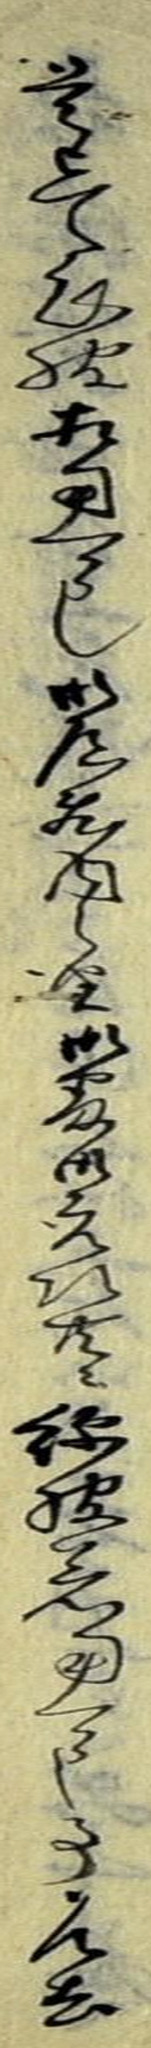是迄之衣服相用可申候御屋敷内之儀は御番御取次共に綿服着用可申事乍去

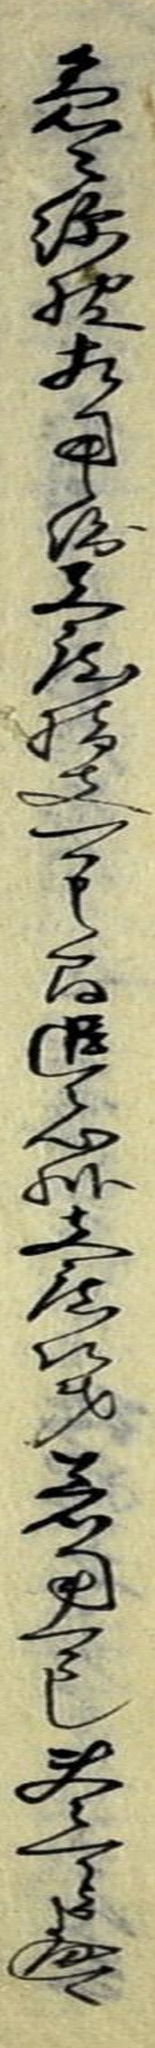急に綿服相用之儀支度指支可申候間追々心掛支度次第着用可申候夫々可被申通候
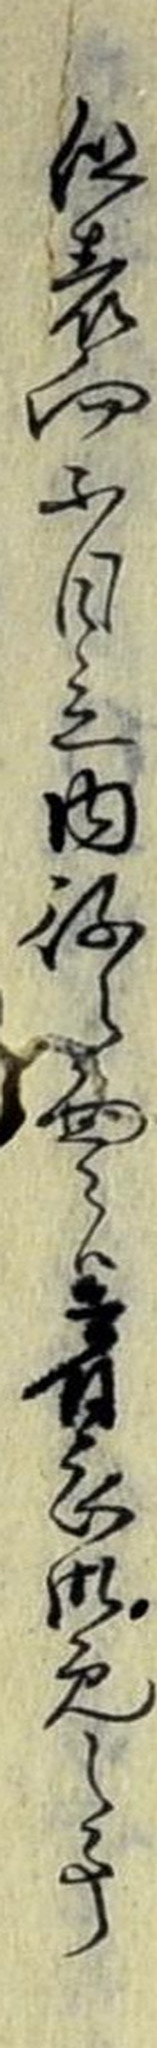但表向不目立内役之面々は肩衣御免之事
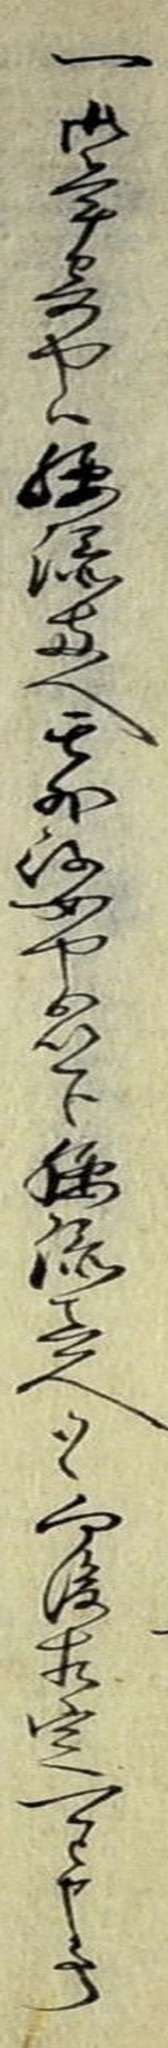一御年寄中は腰添両人其外役女中ゟ以下腰添壱人ツヽ向後相定可被申事
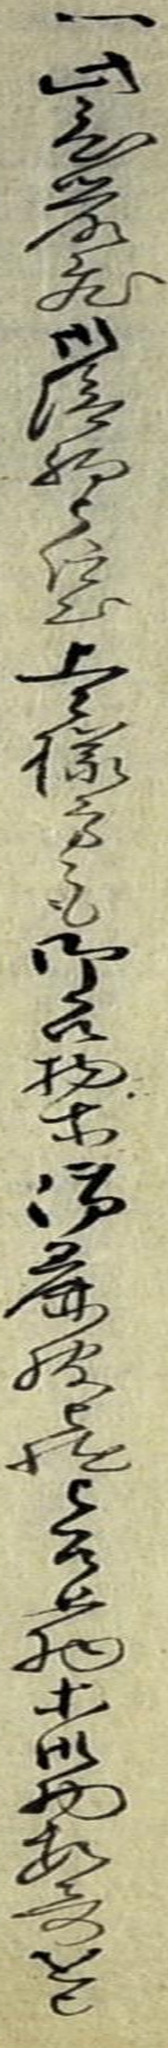一此度厳敷御倹約被仰出上々様方にも御召物等御麁服被遊被召上物等御物数寄を被
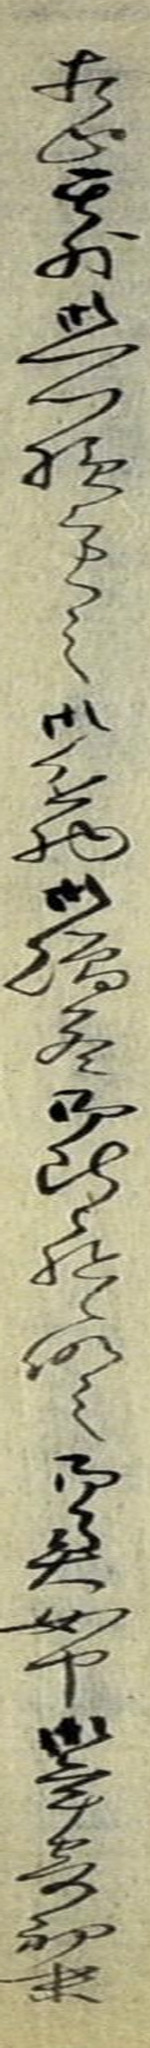相止其外御一門様方へ之御進物御贈答御断被遊候仍之御奥女中御年寄初末
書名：命令之部 二
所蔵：福井県文書館 Fukui Prefectural Archives
